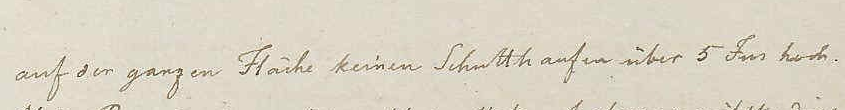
auf der ganzen Fläche keinen Schutthaufen über 5 Fus hoch.
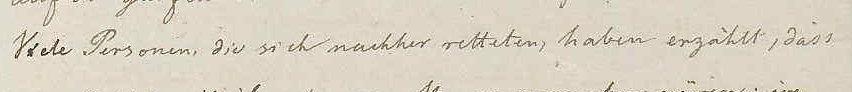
Viele Personen, die sich nachher retteten, haben erzählt, dass
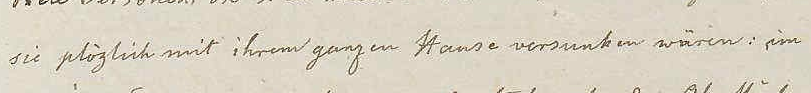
sie plözlich mit ihrem ganzen Hause versunken wären: im
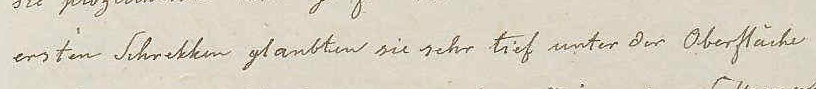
ersten Schrekken glaubten sich sehr tief unter der Oberfläche
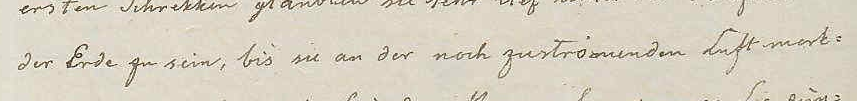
der Erde zu sein, bis sie an der noch zuströmenden Luft merk-
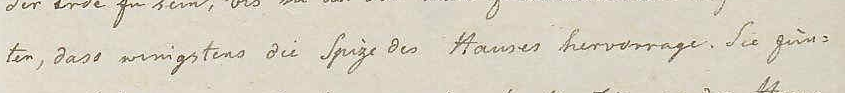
ten, dass wenigstens die Spize des Hauses hervorrage. Sie zün-
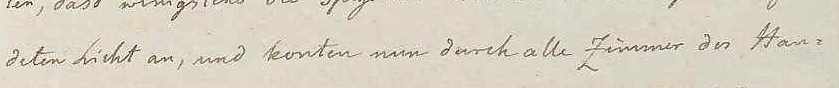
deten Licht an, und konten nun durch alle Zimmer des Hau-
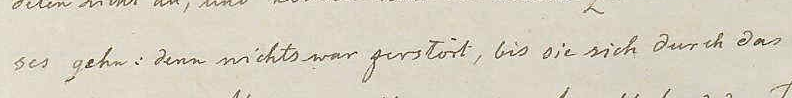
ses gehn: denn nichts war zerstört, bis sie sich durch das
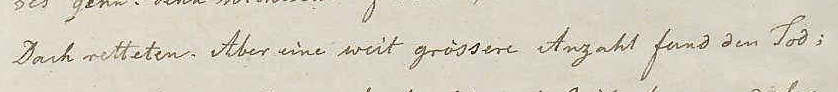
Dach retteten. Aber eine weit grössere Anzahl fand den Tod;
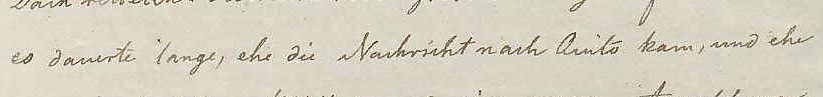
es dauerte lange, ehe die Nachricht nach Quito kam, und ehe
